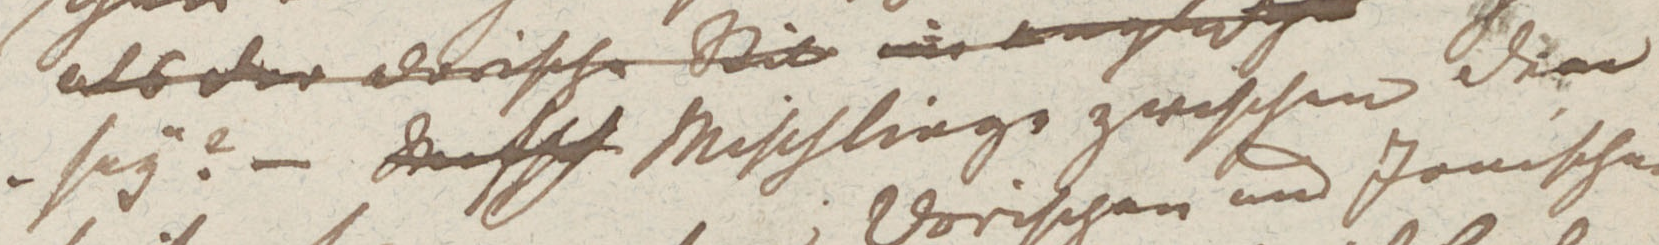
sey? – Misch Mischlinge zwischen dieen
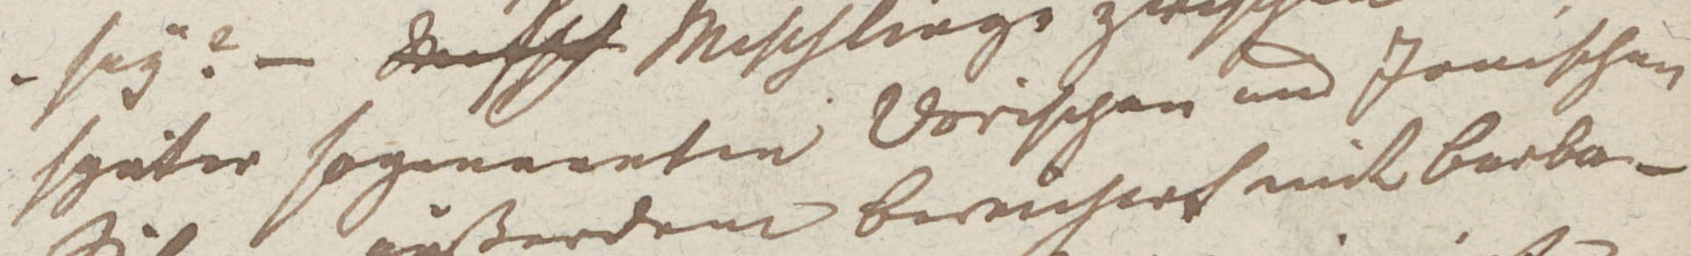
später sogenannten Dorischen und Ionischen
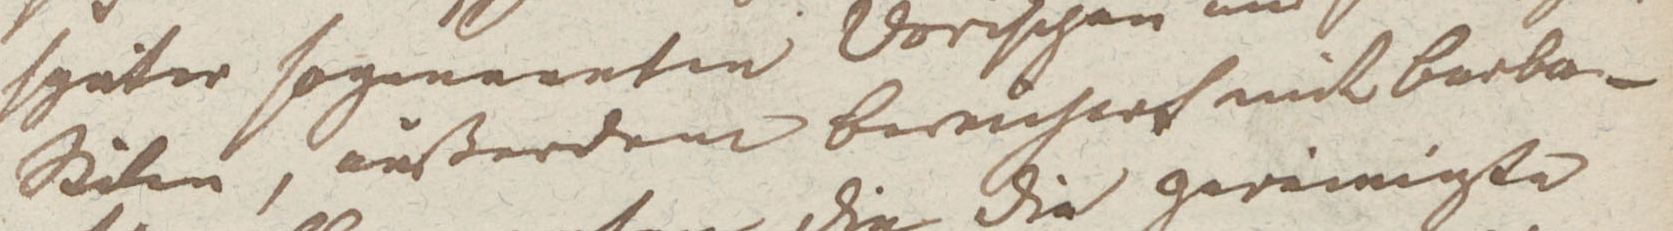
Stilen, ausserdem bereichert mit barba-
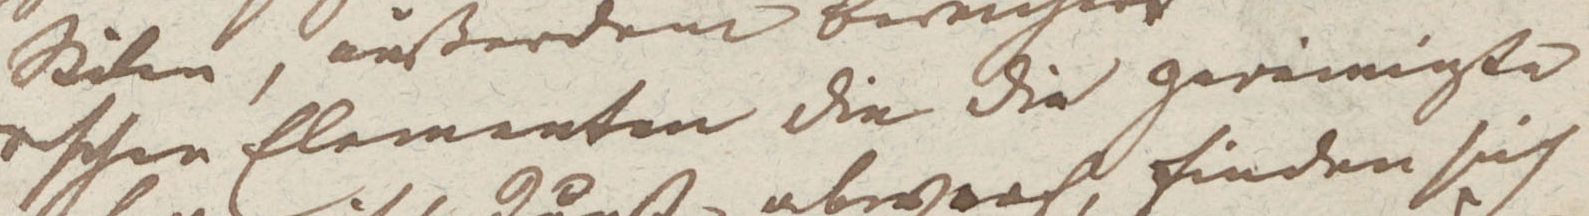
rischen Elementen die die gereinigte
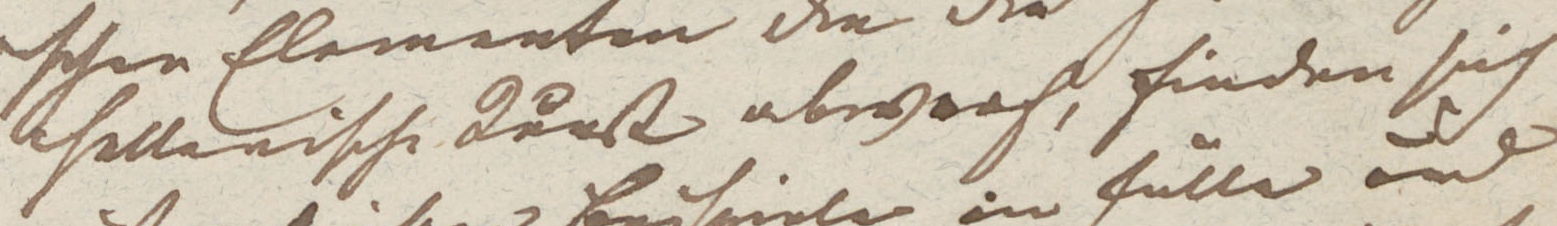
Hellenische Kunst abwarf, finden sich
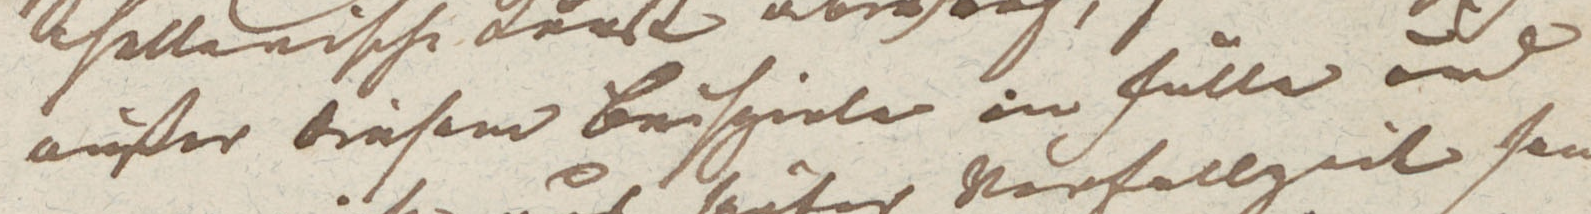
ausser diesem Beispiele in Fülle und
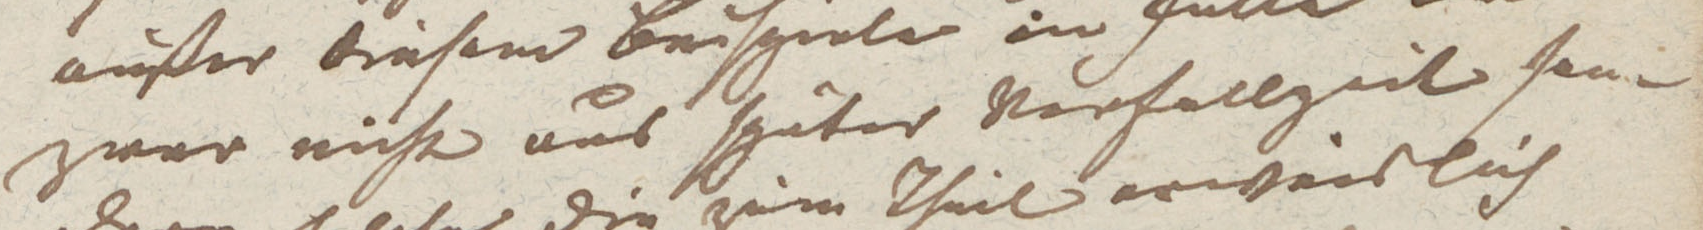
zwar nicht aus später Verfallzeit son-
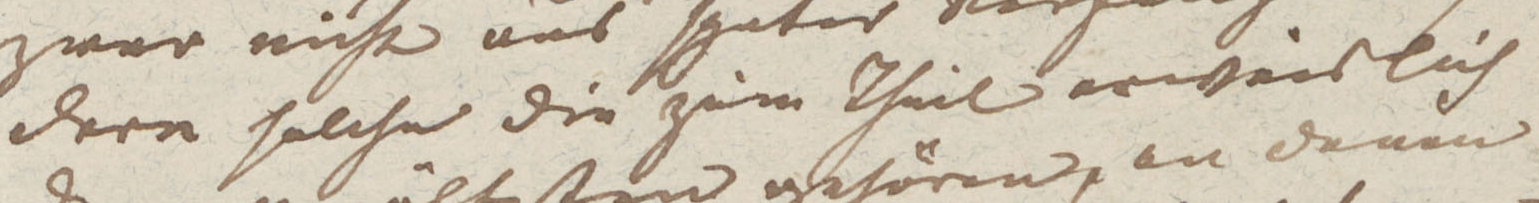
dern solche die zum Theil erweislich
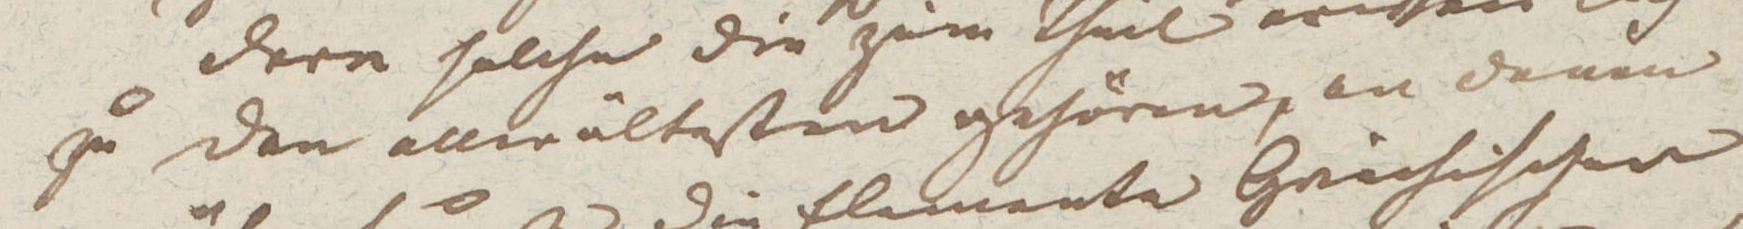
zu den allerältesten gehören, an denen
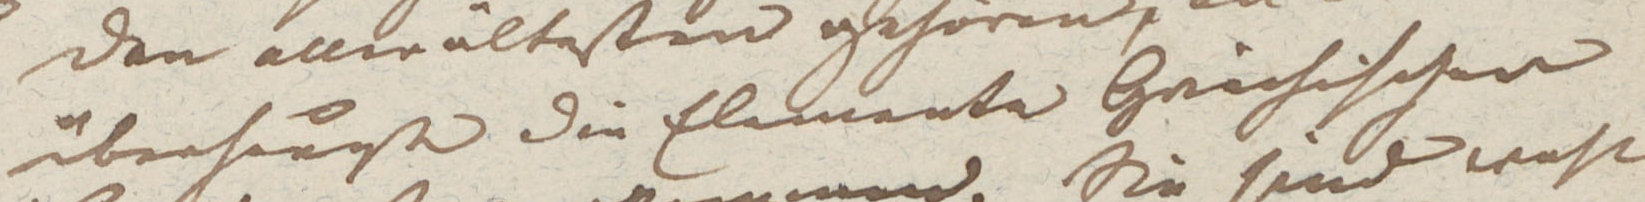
überhaupt die Elemente Griechischer
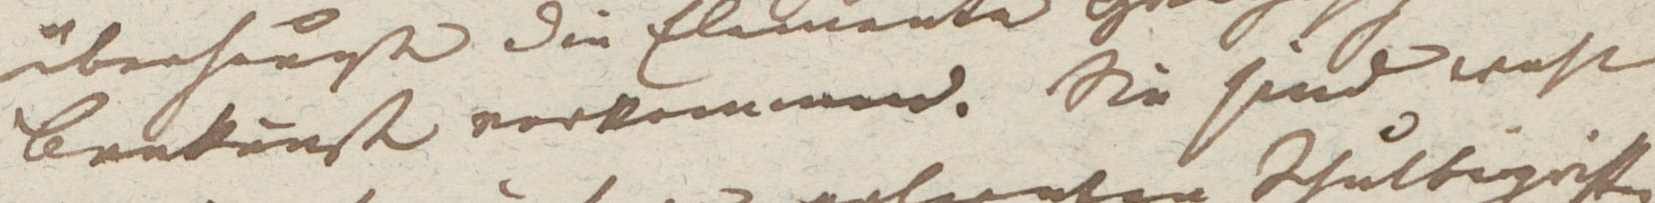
Baukunst vorkommen. Sie sind wohl
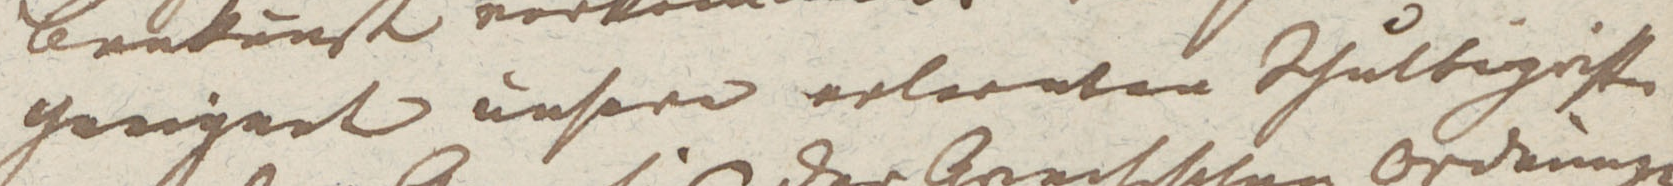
geeignet unsern erlernten Schulbegriffe
